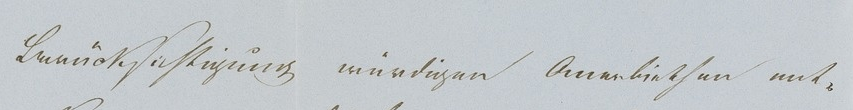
Berücksichtigung würdigen Anerbiethen ent-
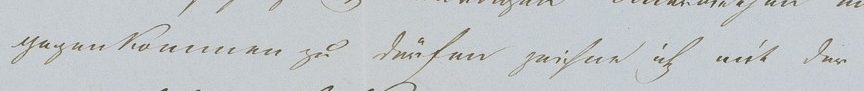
gegenkommen zu dürfen zeichne ich mit der
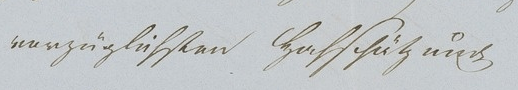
vorzüglichsten Hochschätzung
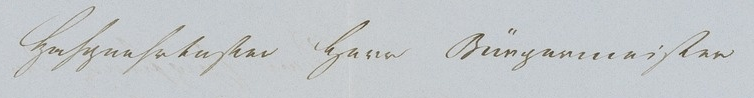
Hochgeehrtester Herr Bürgermeister
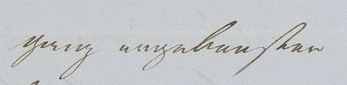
ganz ergebenster
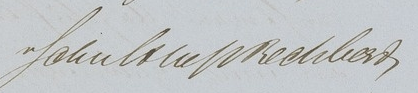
Schulthess Rechberg
